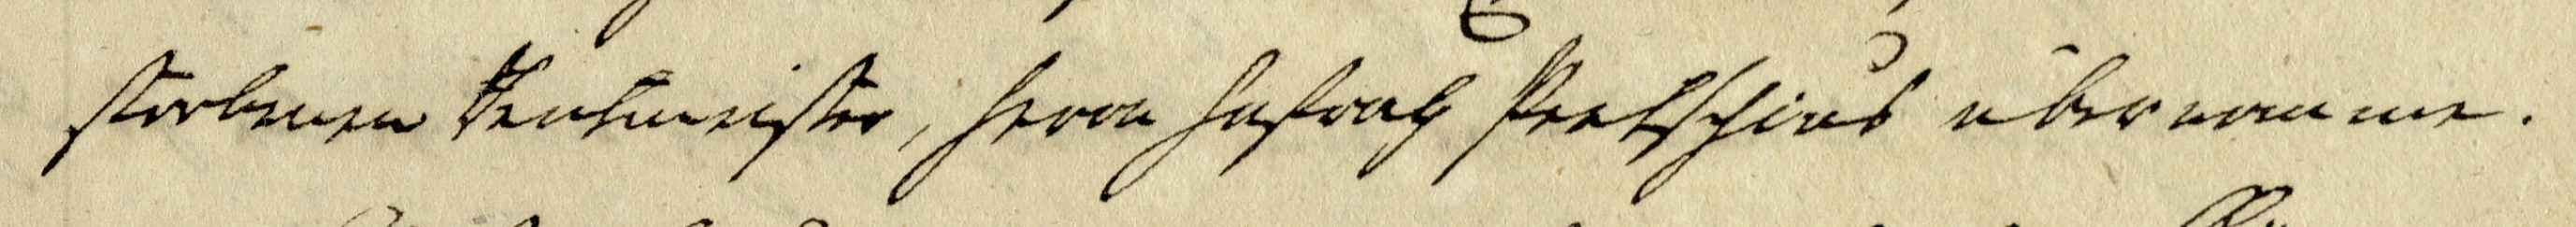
storbenen Rentmeister, Herrn Hofrath Peetschius übernomme¬
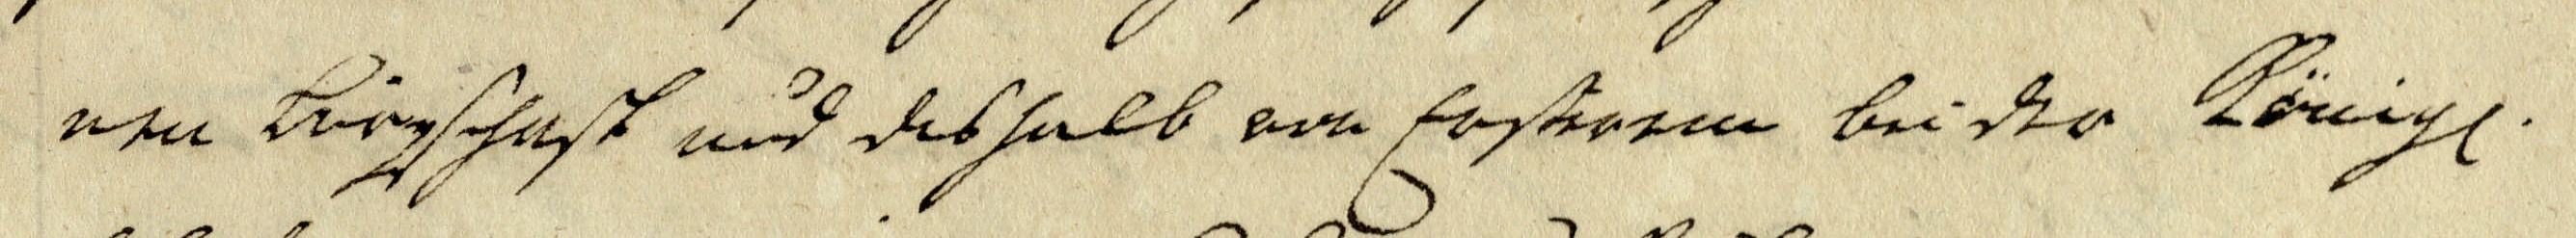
nen Bürgschaft und deshalb von Ersterem bei der Königl.
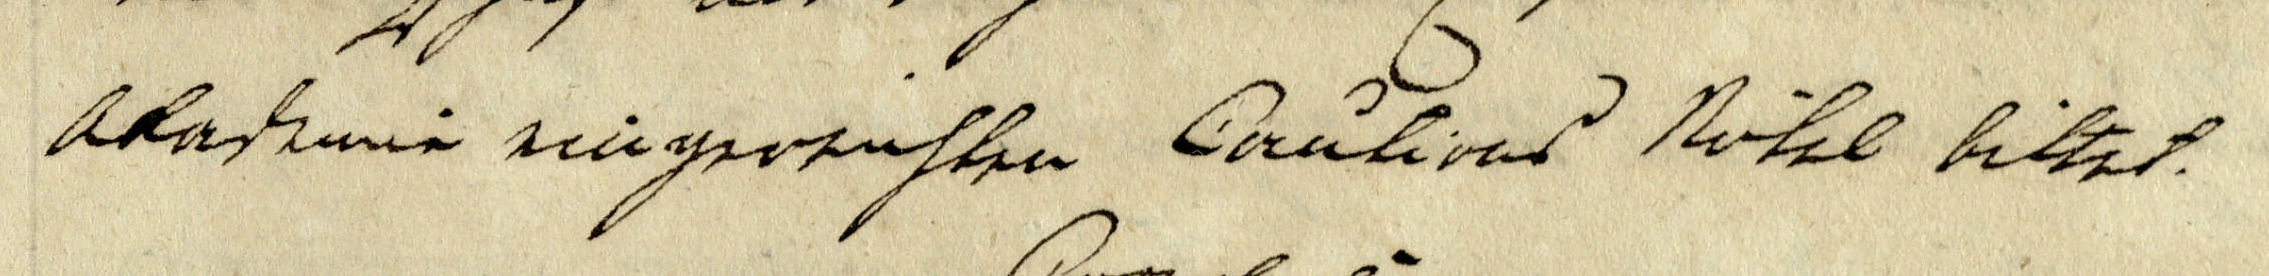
Akademie eingereichten Cautions Notel bittet.
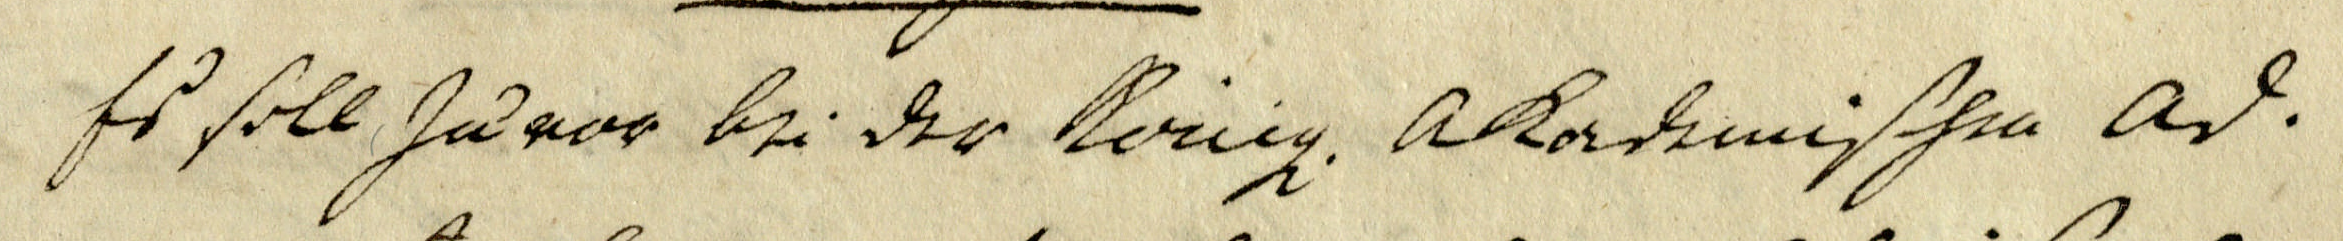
Es soll zuvor bei der König. Akademischen Ad¬
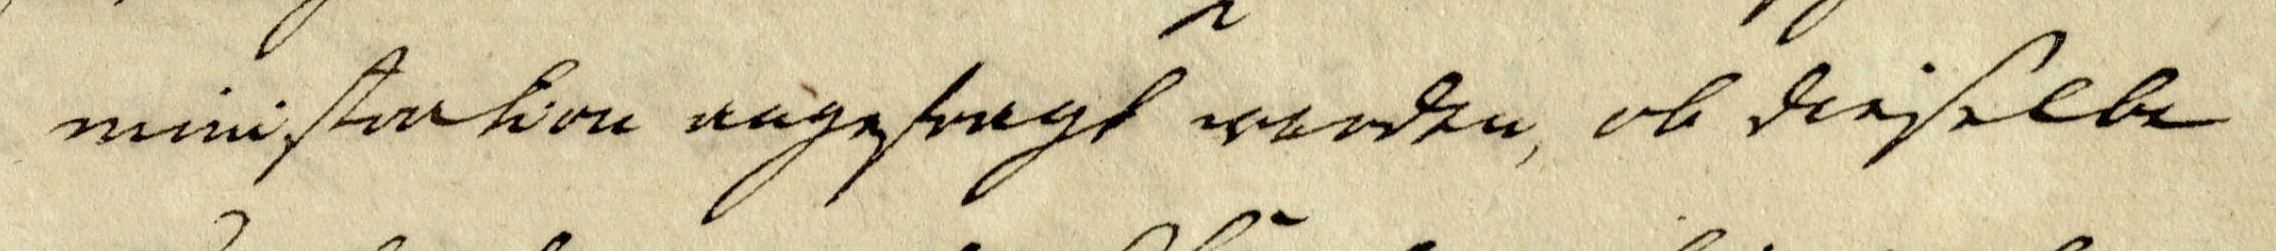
ministration angefragt werden, ob dieselbe
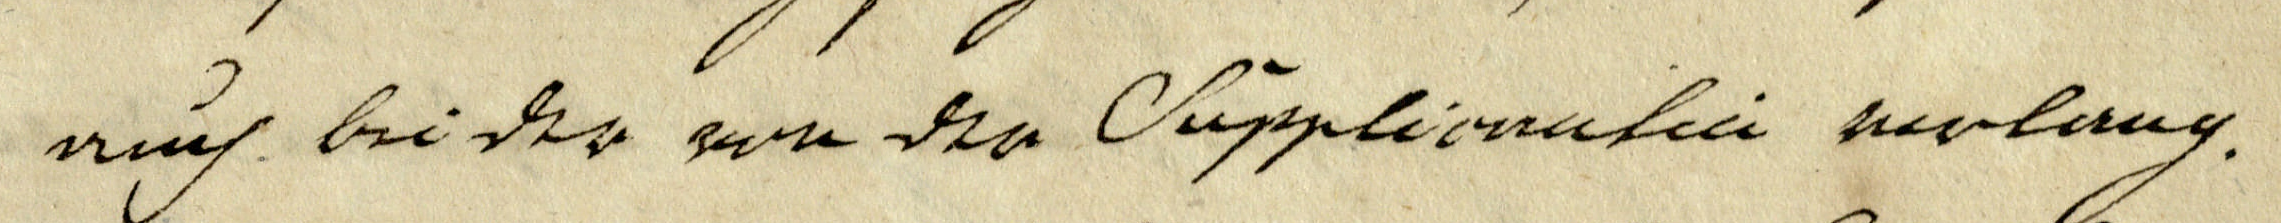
auch bei der von der Supplicantin verlang¬
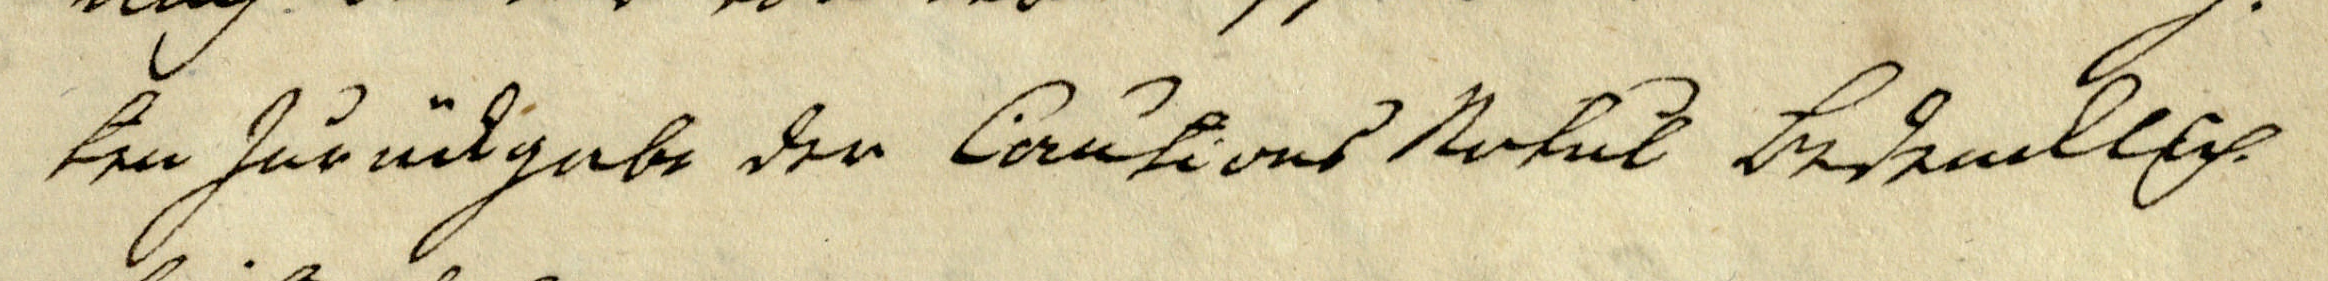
ten Zurückgabe der Cautions Notul Bedencklich¬
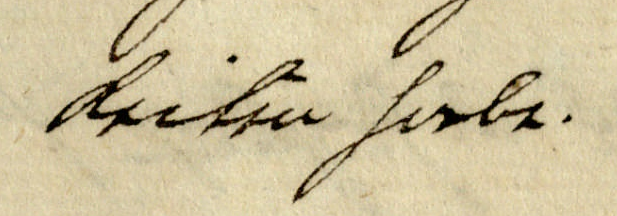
keiten habe.
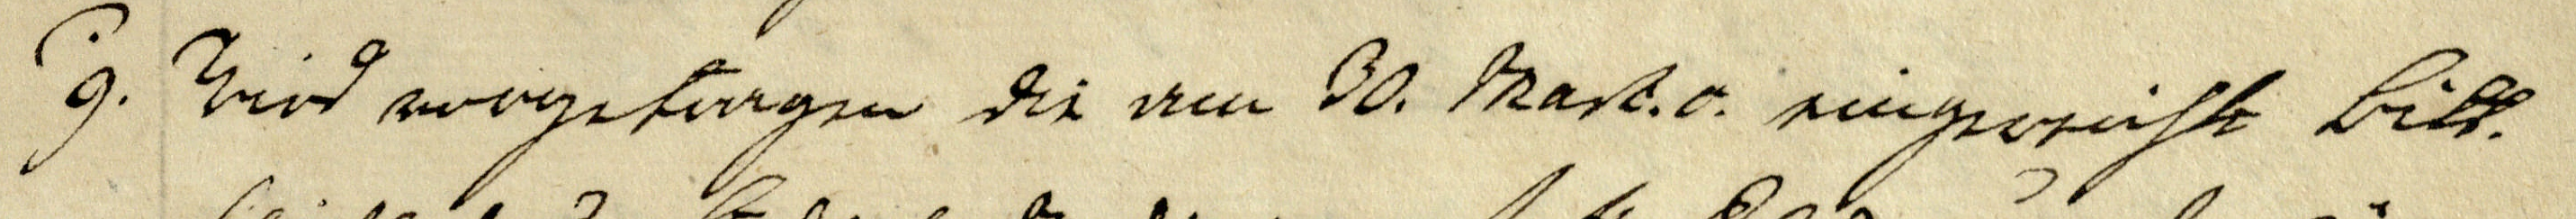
9. Wird vorgetragen die am 30. Mart. c. eingereichte Bitt¬
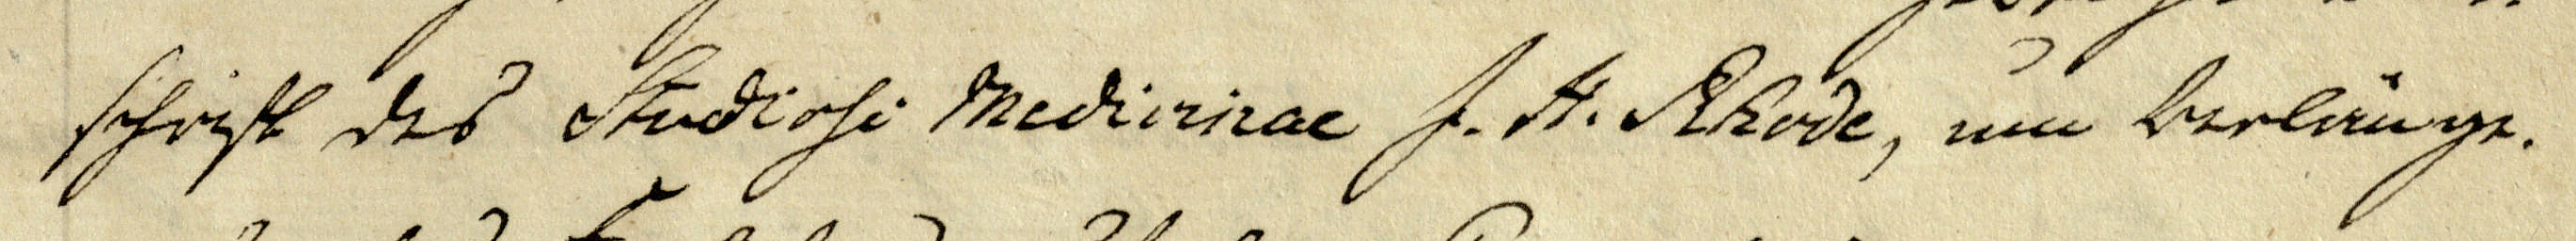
schrift des Studiosi Medicinae J. H. Rhode, um Verlänge¬
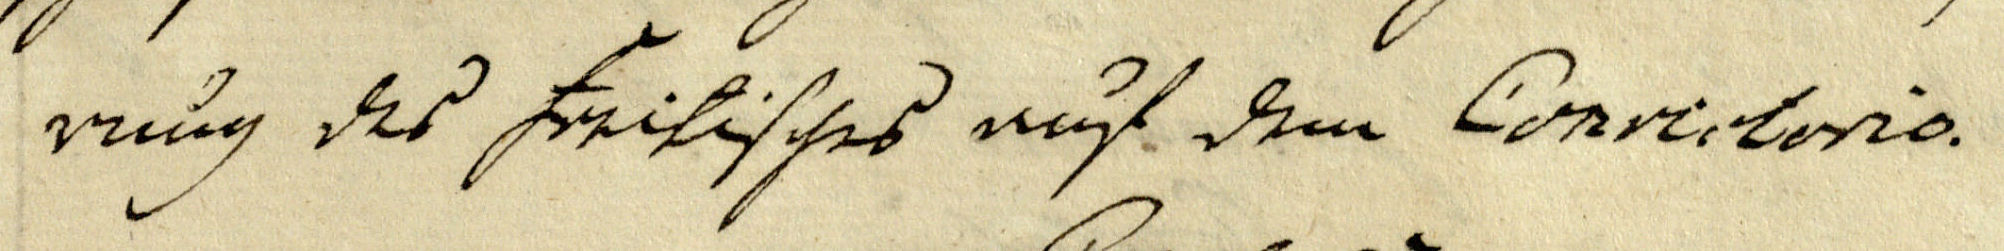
rung des Freitisches auf dem Convictorio.
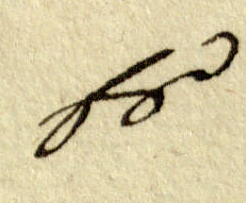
Es
